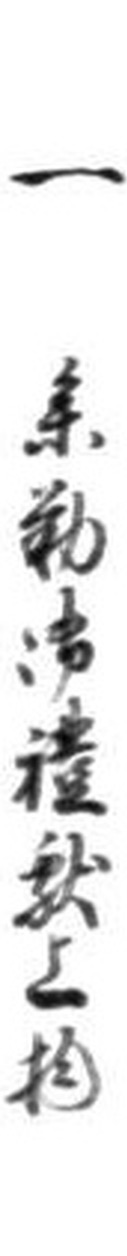一参勤御礼献上物
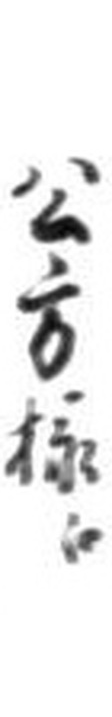公方様江
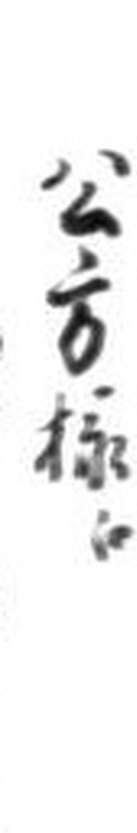公方様江
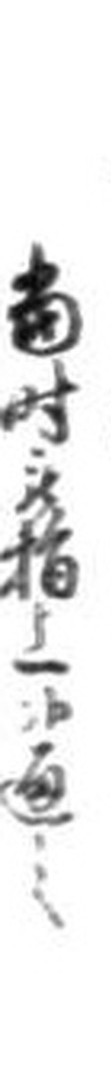当時被指上候通之
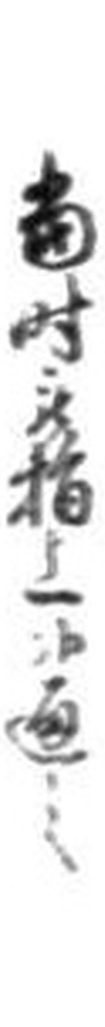当時被指上候通之
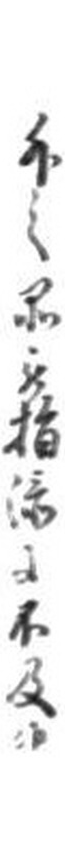外之品被指添に不及候
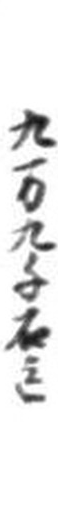九万九千石迄
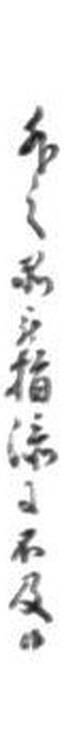外之品被指添に不及候
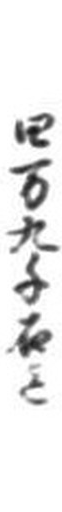四万九千石迄

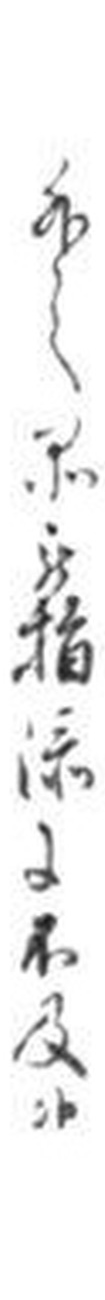外之品被指添に不及候
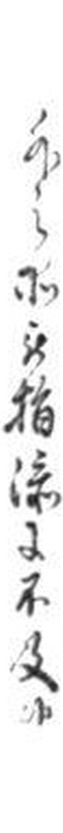外之品被指添に不及候
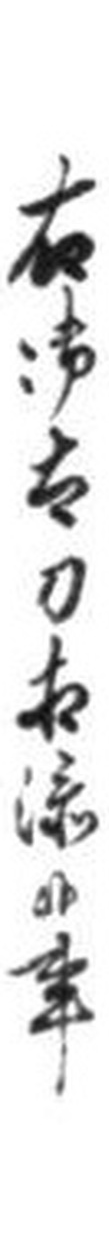右御太刀相添候事
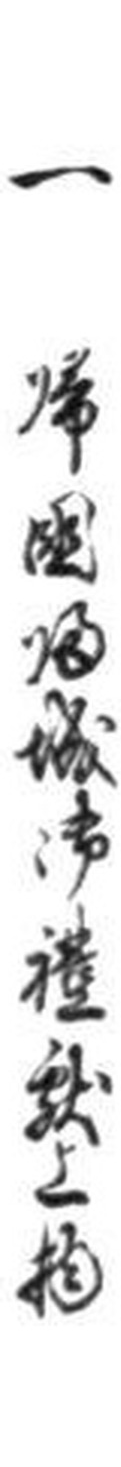一帰国帰城御礼献上物
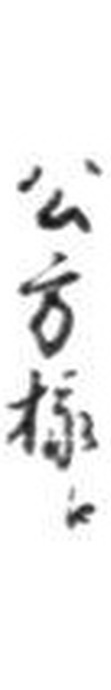公方様江
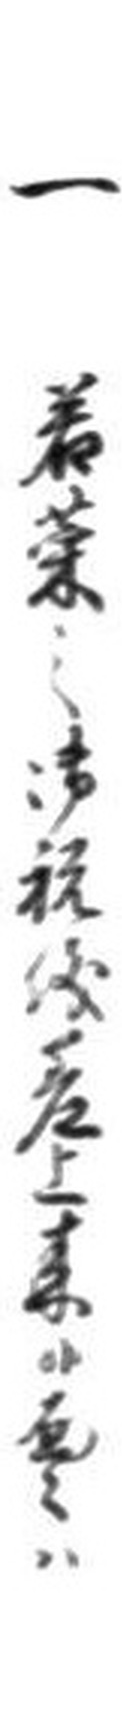一若菜之御祝儀差上来候面々ハ
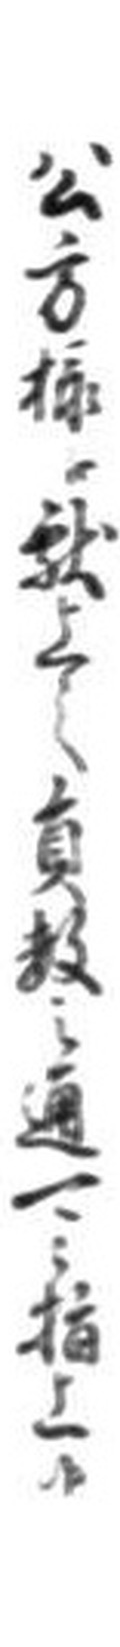公方様江献上之員数之通可被指上候
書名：家譜 三十八 宗矩公 従享保九年五月到享保九年十二月
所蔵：福井県文書館 Fukui Prefectural Archives
